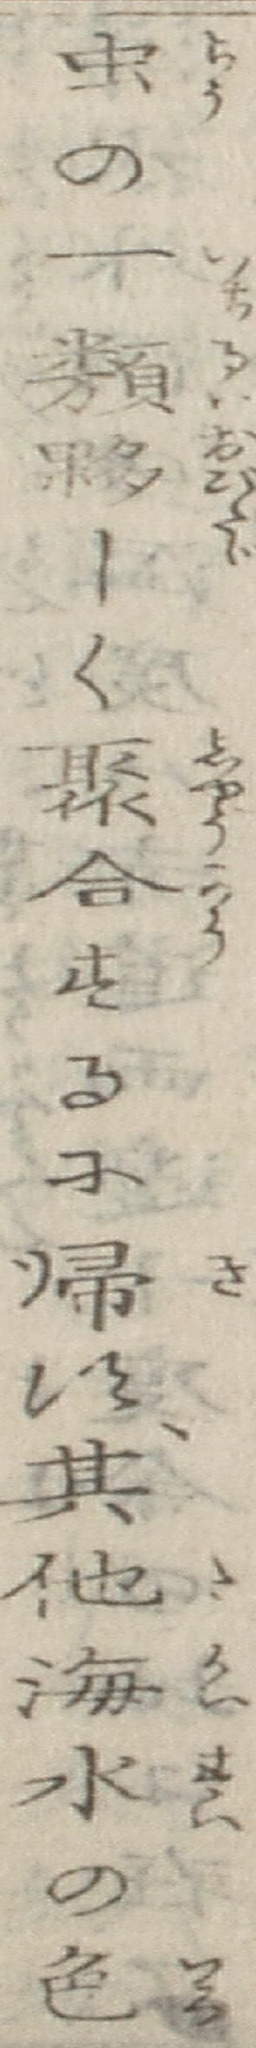虫の一類夥しく聚合するに帰す、其他海水の色
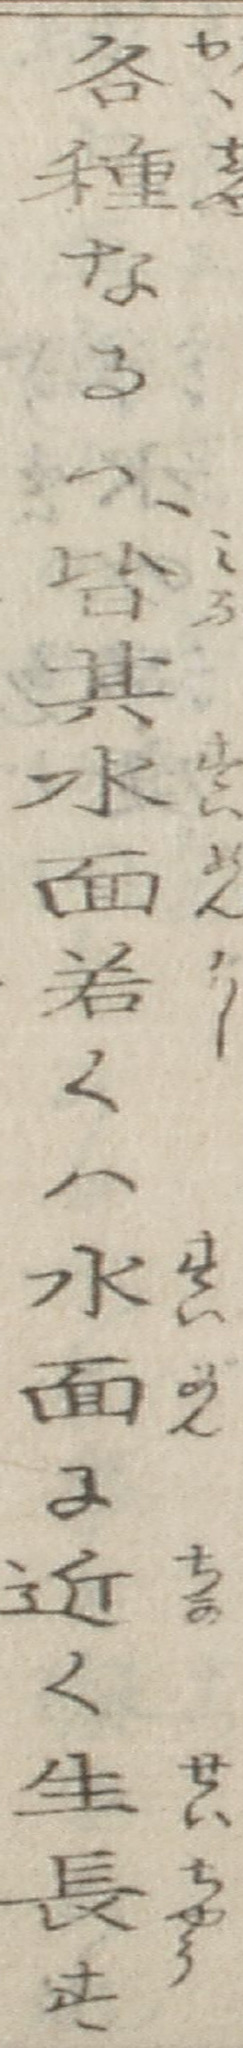各種なるは、皆其水面若くは水面に近く生長す
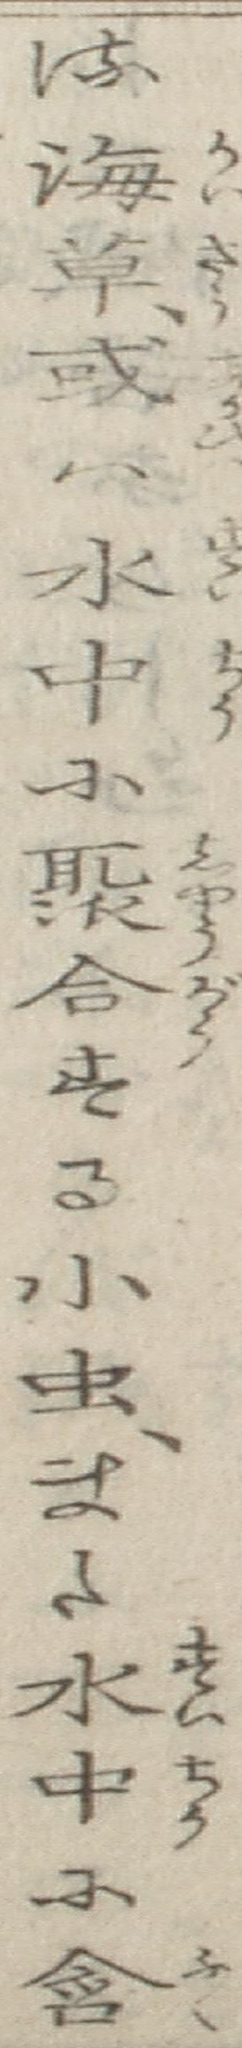る海草、或は水中に聚合する小虫、また水中に含
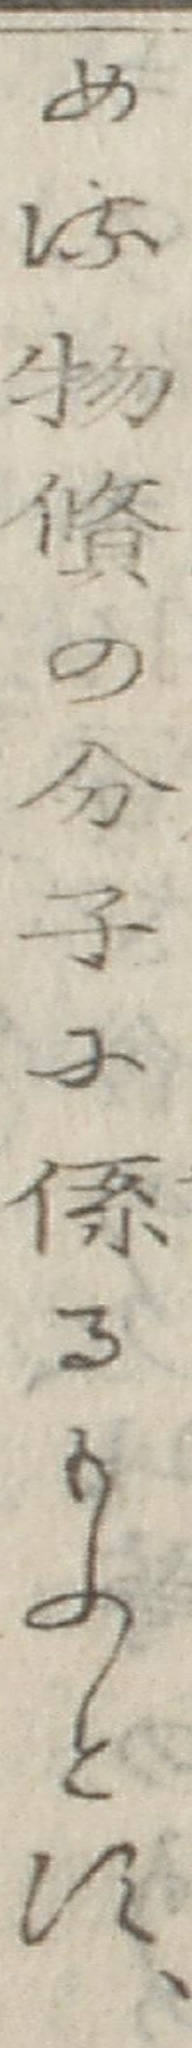める物質の分子に係るものとす、
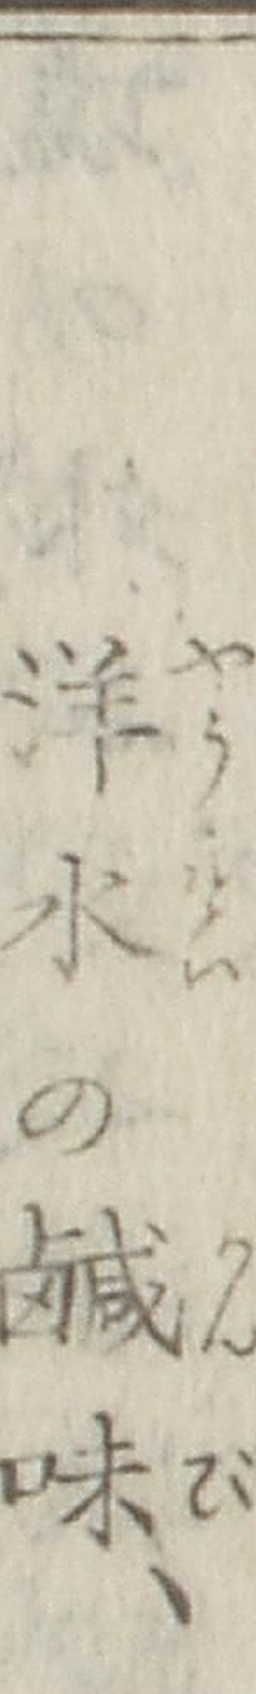洋水の鹹味、
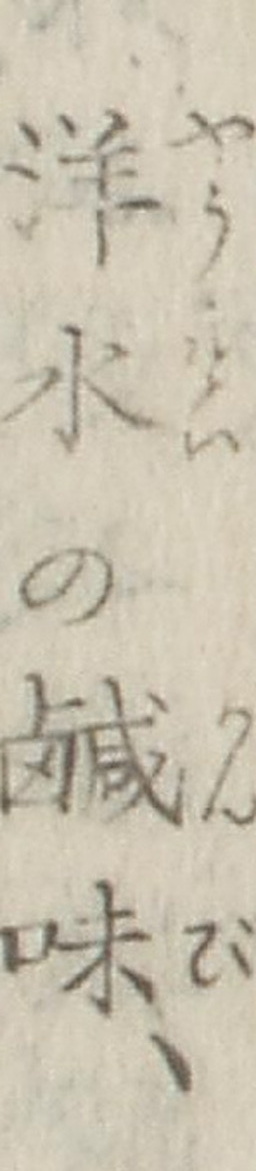洋水の鹹味、
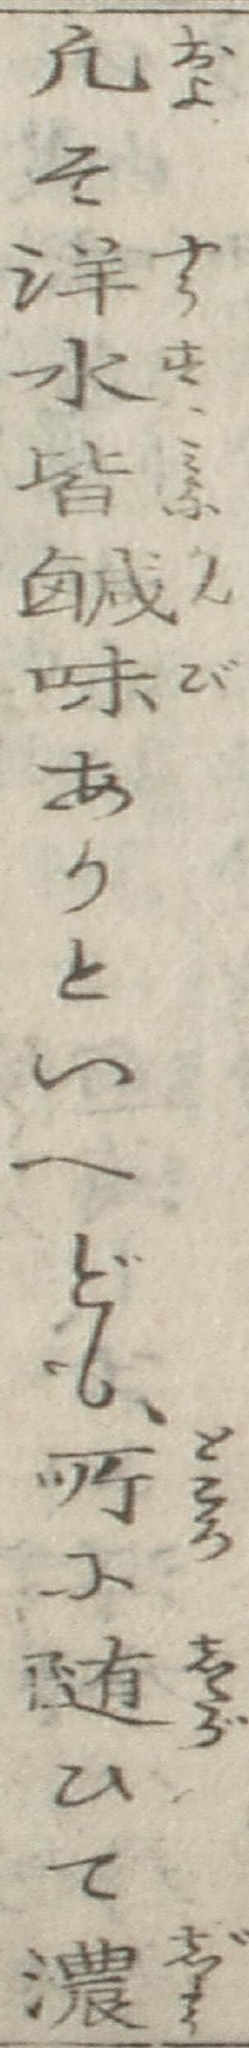凡そ洋水皆鹹味ありといへども、所に随ひて濃
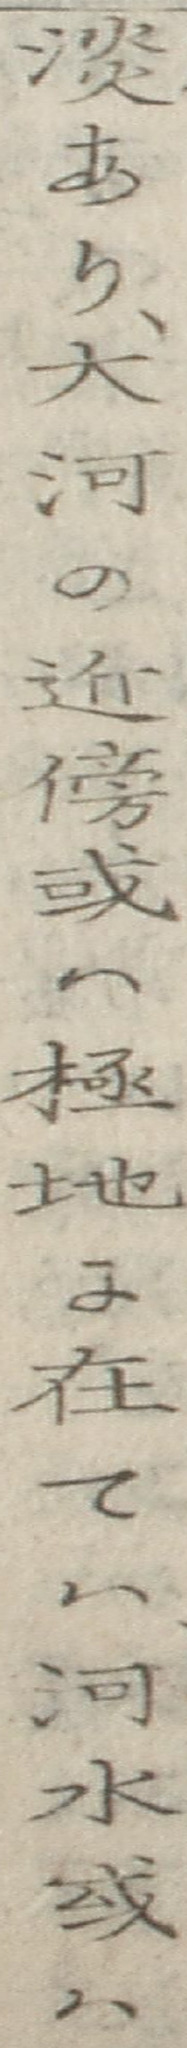淡あり、大河の近傍或は極地に在ては、河水或は

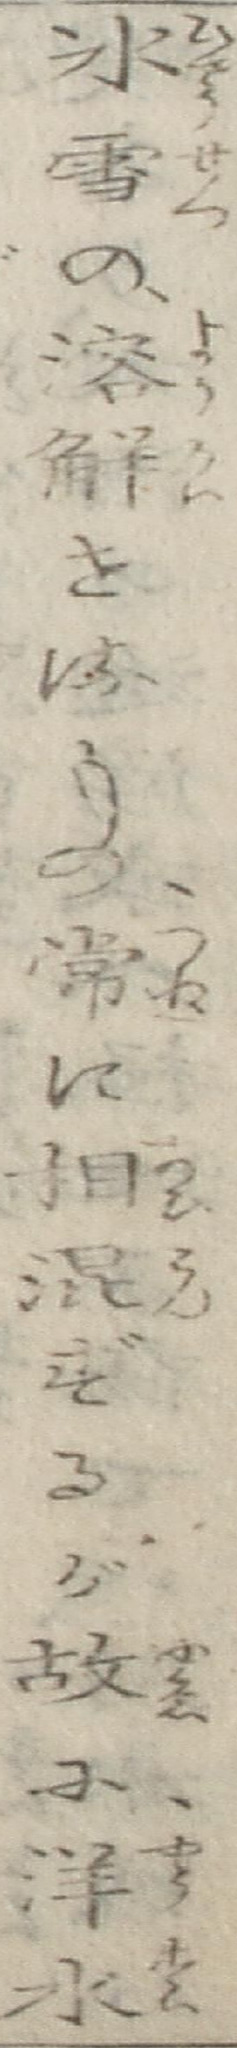氷雪の溶解せるもの、常に相混ずるが故に、洋水
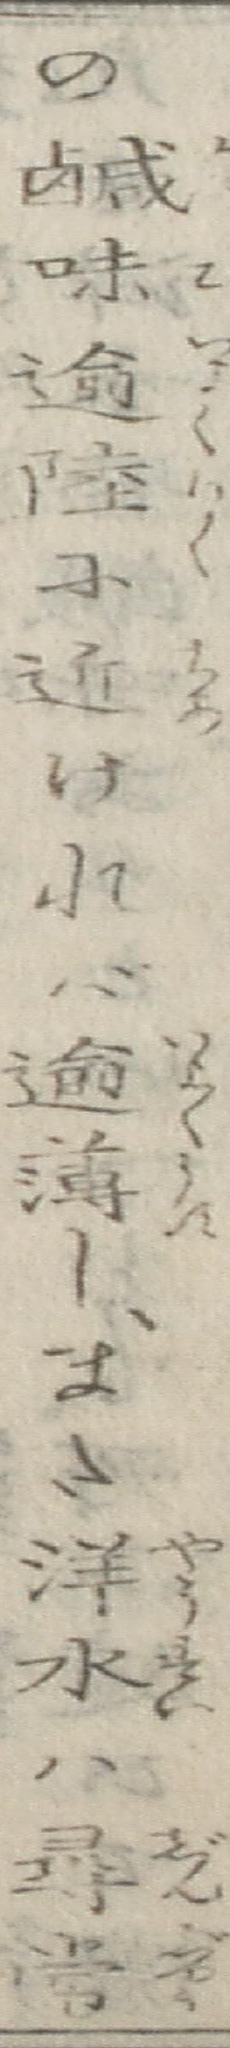の鹹味愈陸に近ければ愈薄し、また洋水は尋常
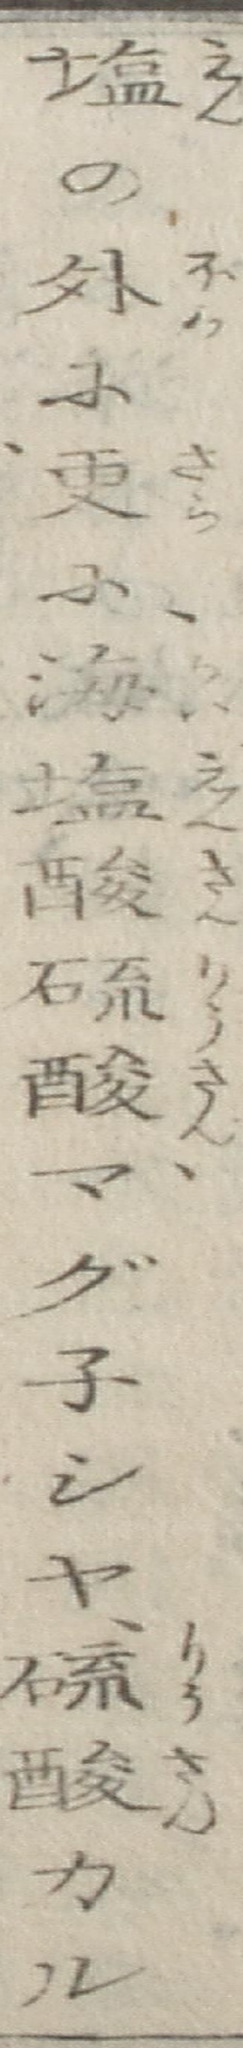塩の外に更に、海塩酸硫酸、マグネシヤ、硫酸カル
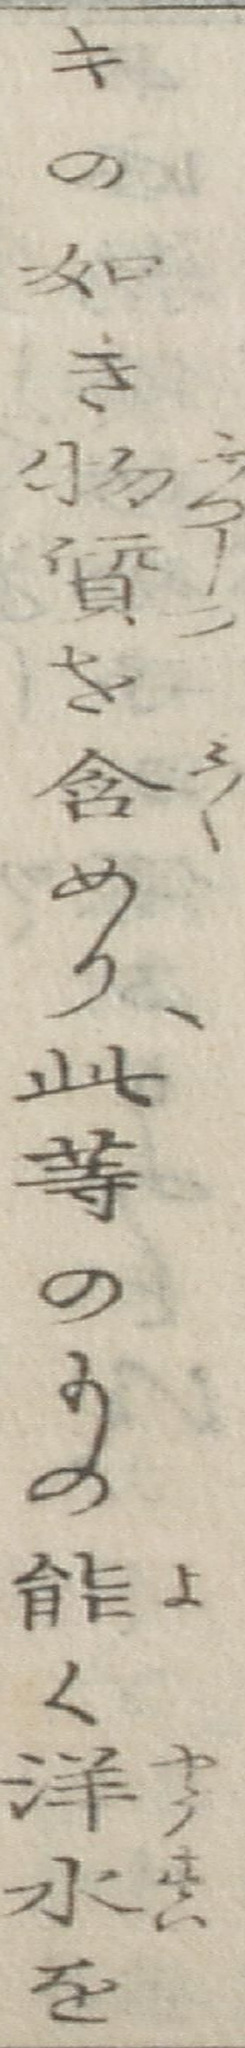キの如き物質を含めり、此等のもの能く洋水を
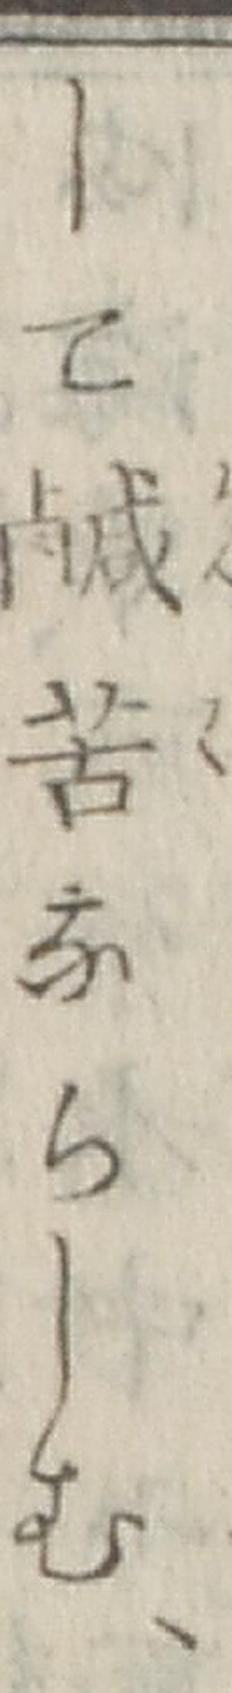して鹹苦ならしむ、
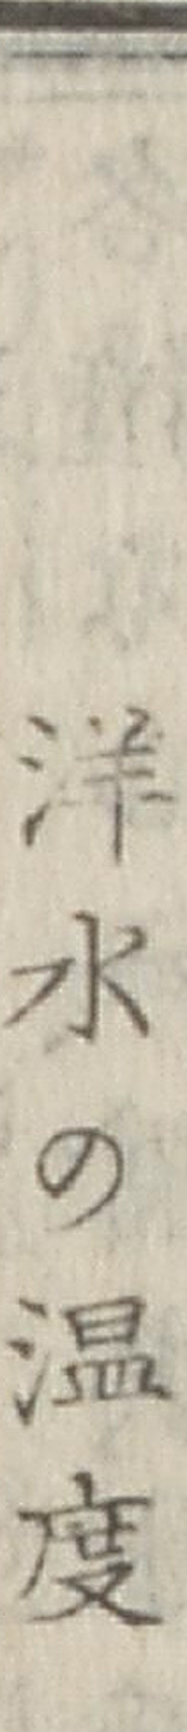洋水の温度
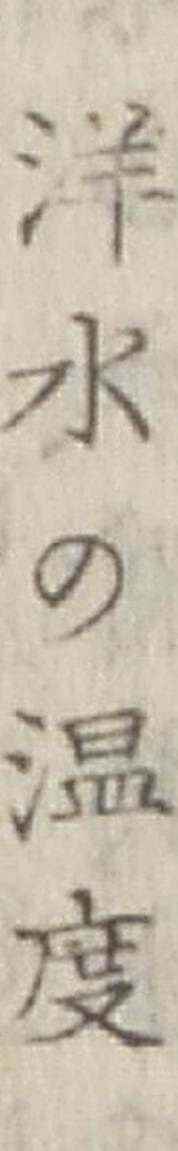洋水の温度
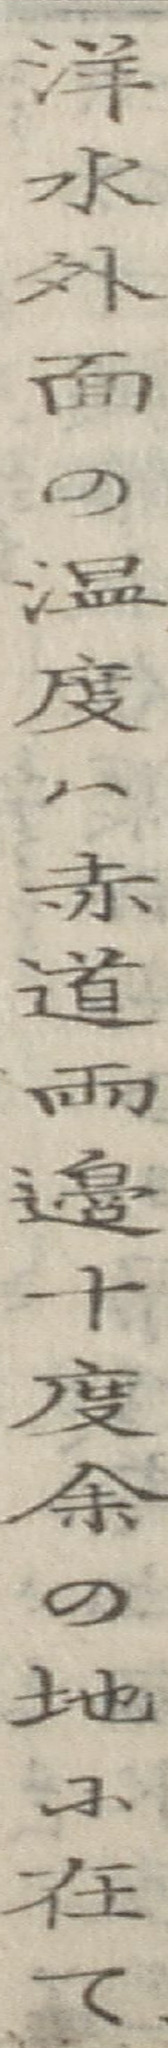洋水外面の温度は、赤道両辺十度余の地に在て、
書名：訓蒙　天然地理學　中
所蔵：東京大学地震研究所図書室 Earthquake Research Institute Library, The University of Tokyo, JAPAN
